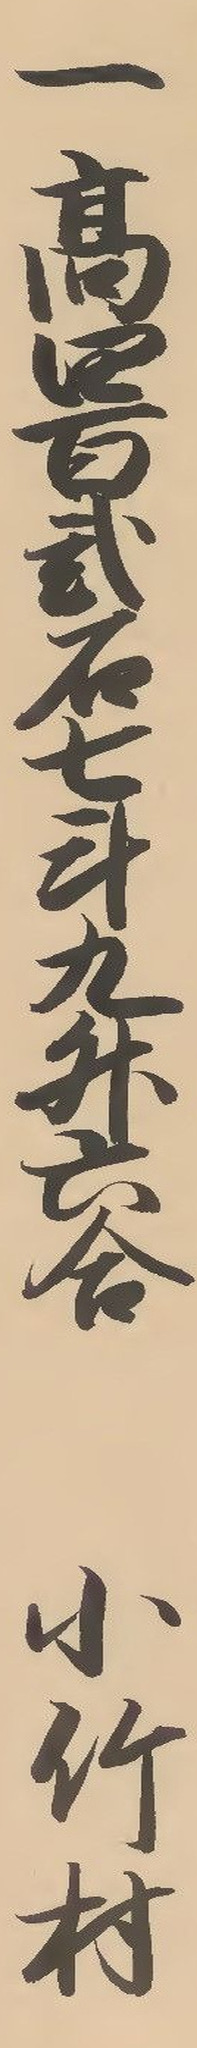一高四百弐石七斗九升六合小竹村
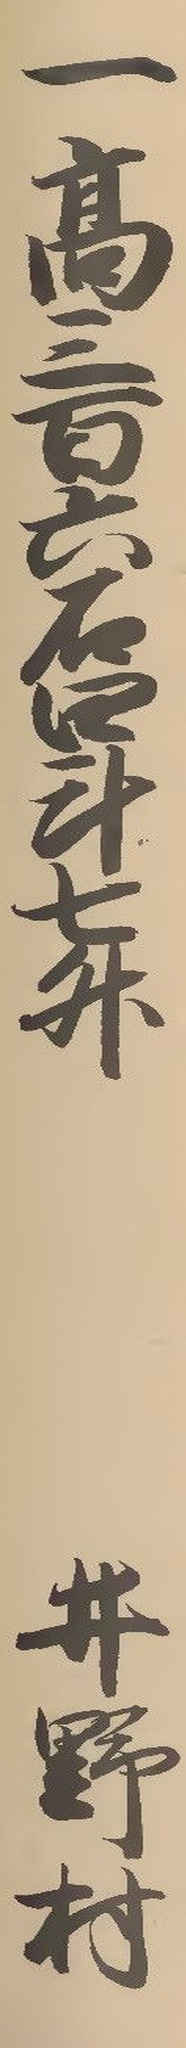一高三百六石四斗七升井野村
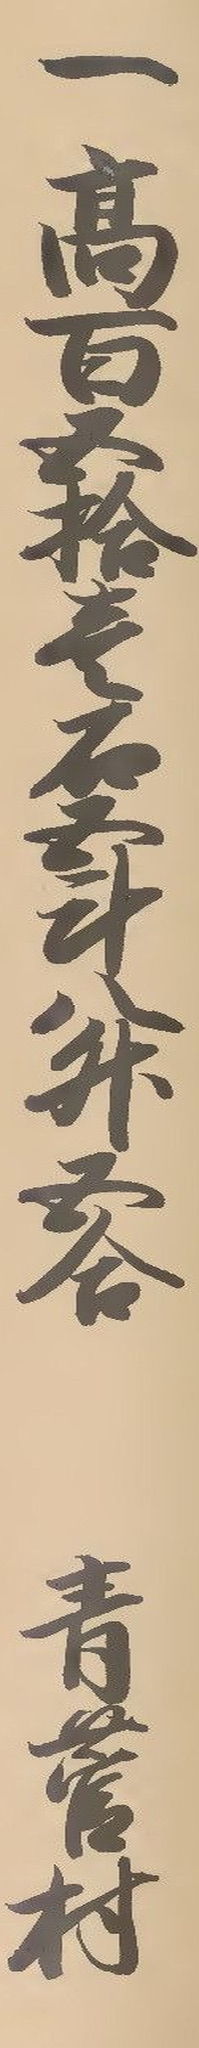一高百五拾壱石五斗八升五合青菅村
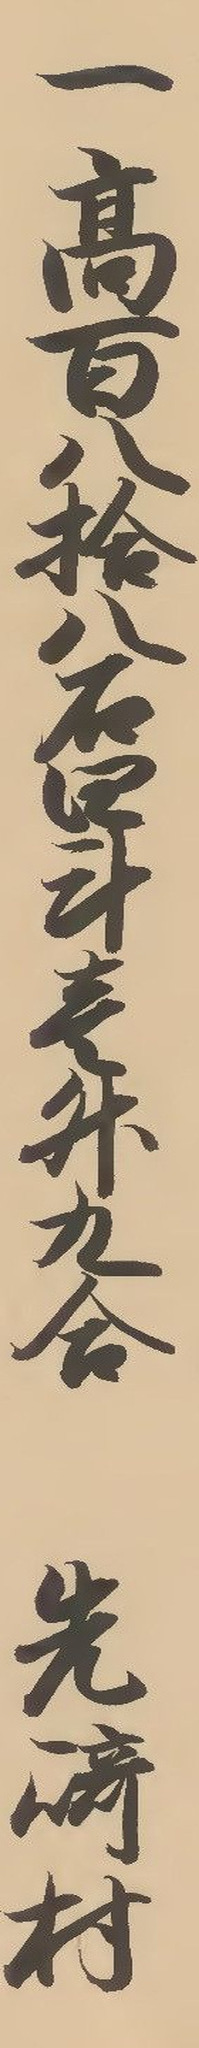一高百八拾八石四斗壱升九合先崎村
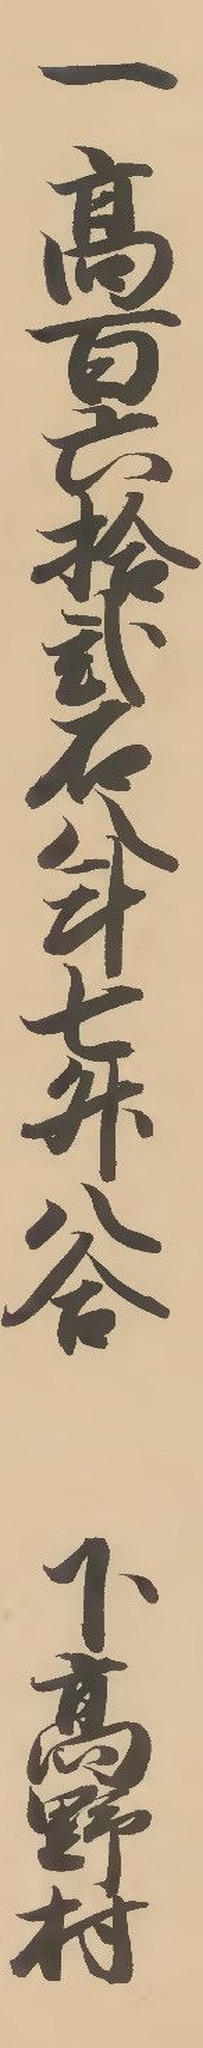一高百六拾弐石八斗七升八合下高野村
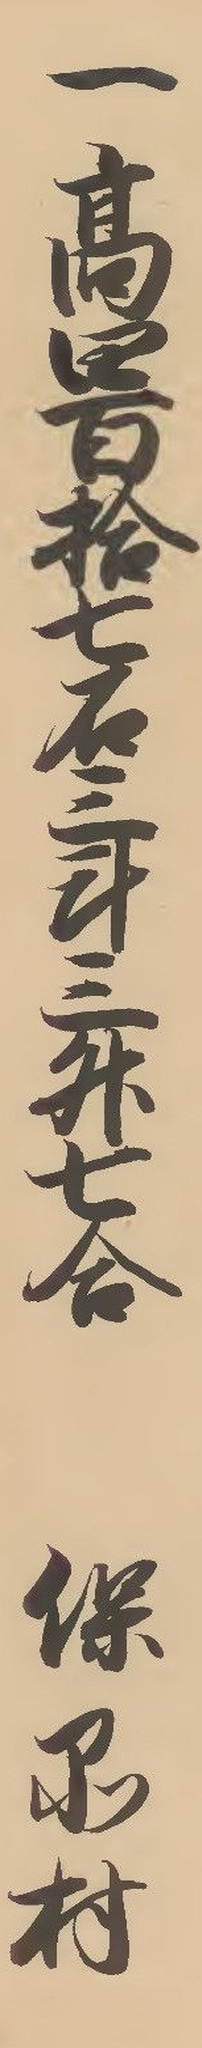一高四百拾七石三斗三升七合保品村

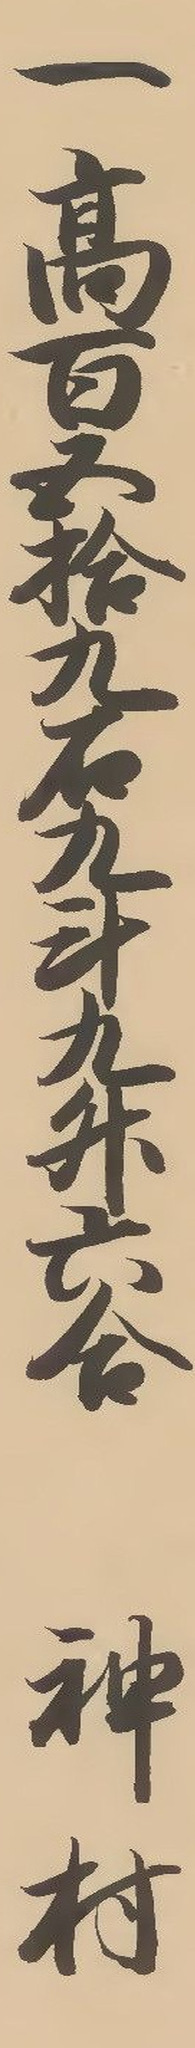一高百五拾九石九斗九升六合神村
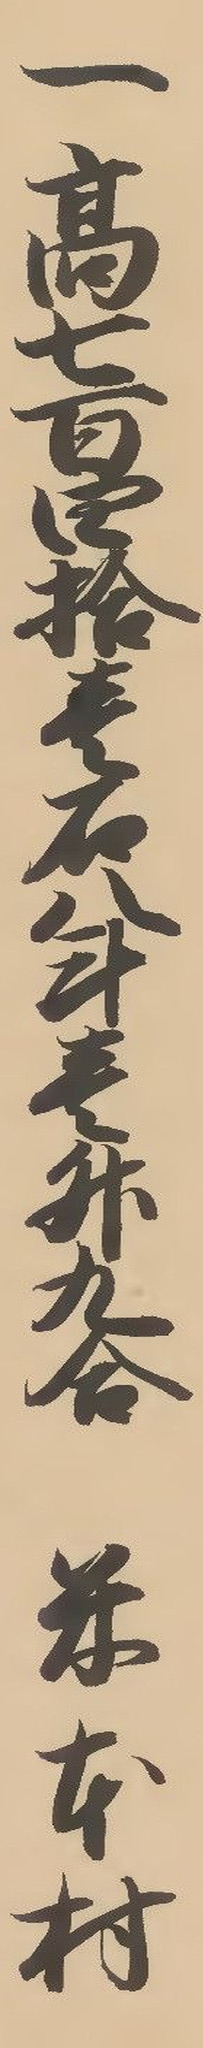一高七百四拾壱石八斗壱升九合米本村
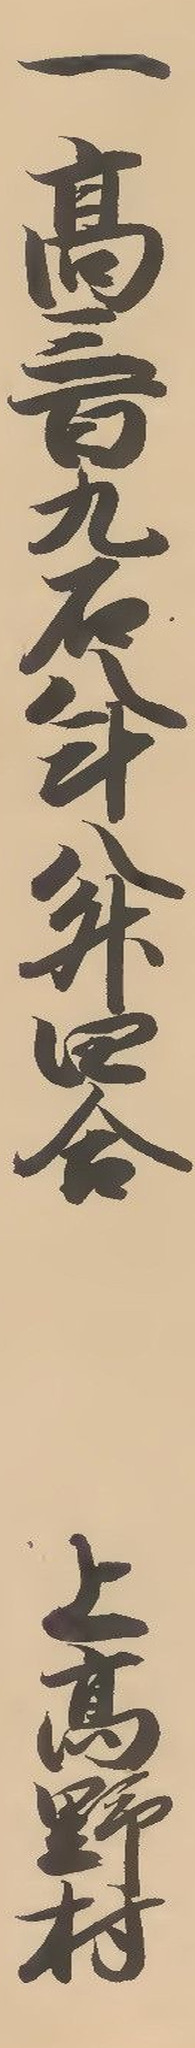一高三百九石八斗八升四合上高野村
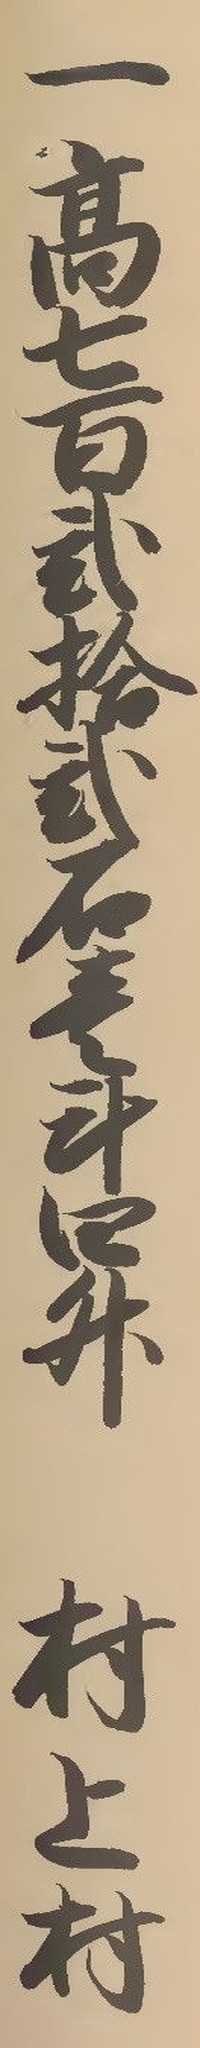一高七百弐拾弐石壱斗四升村上村
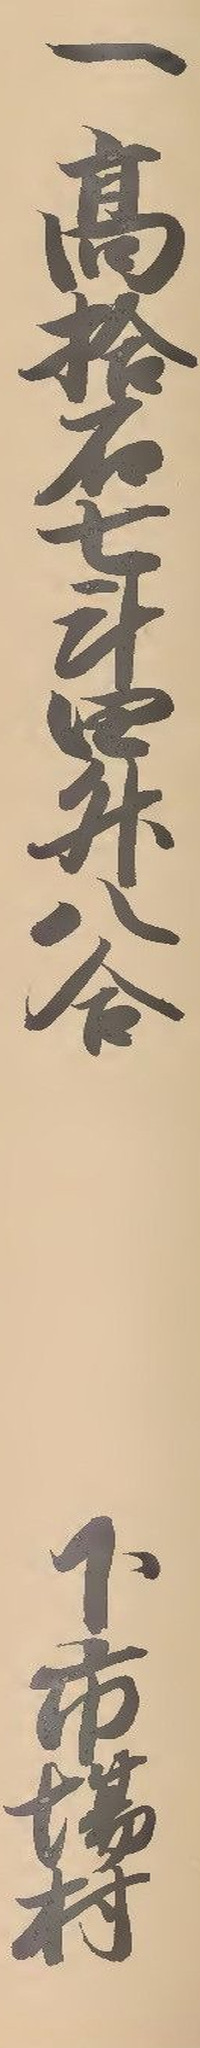一高拾石七斗四升八合下市場村
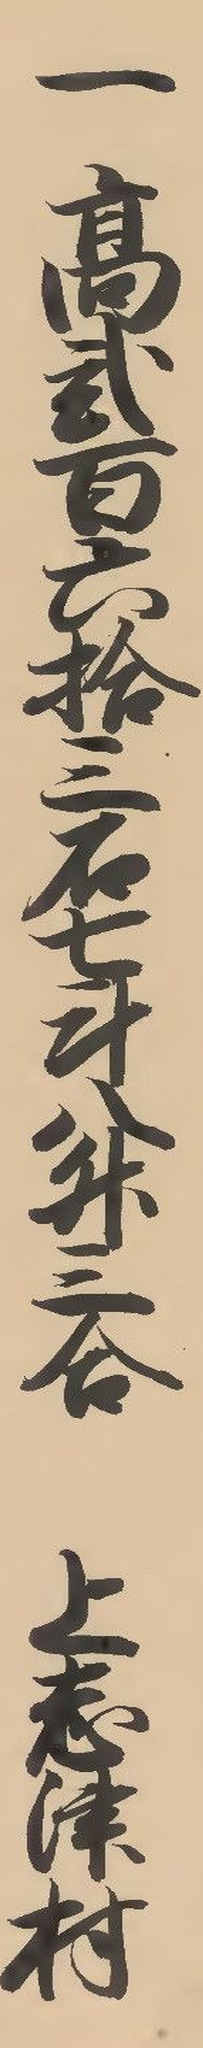一高弐百六拾三石七斗八升三合上志津村
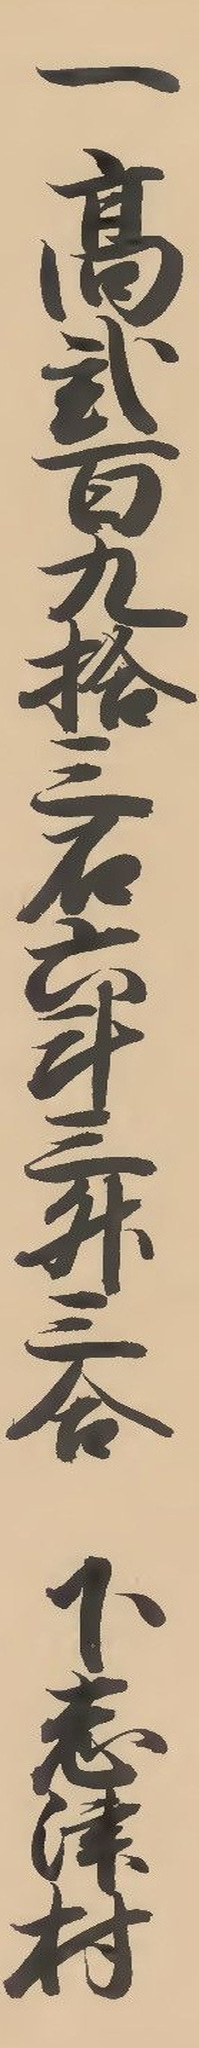一高弐百九拾三石六斗三升三合下志津村
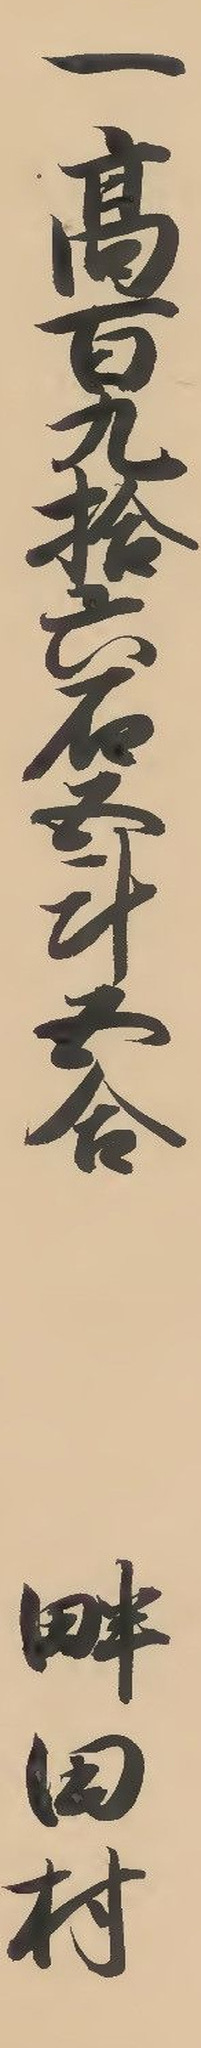一高百九拾六石五斗五合畔田村

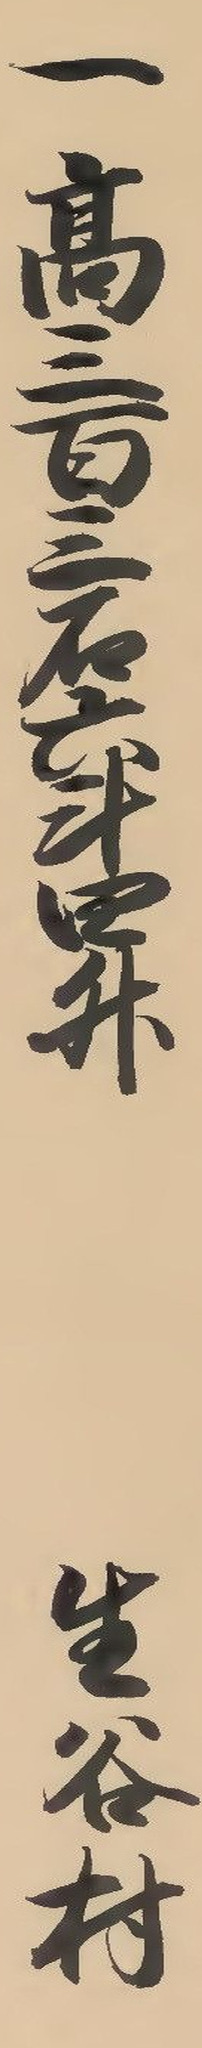一高三百三石六斗四升生谷村
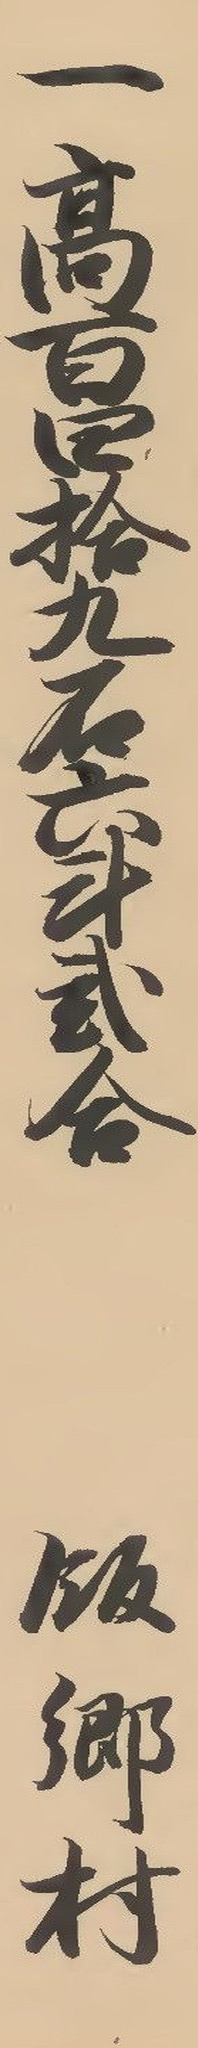一高百四拾九石六斗弐合飯郷村
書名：下総国郷帳
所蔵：国立公文書館 National Archives of Japan
